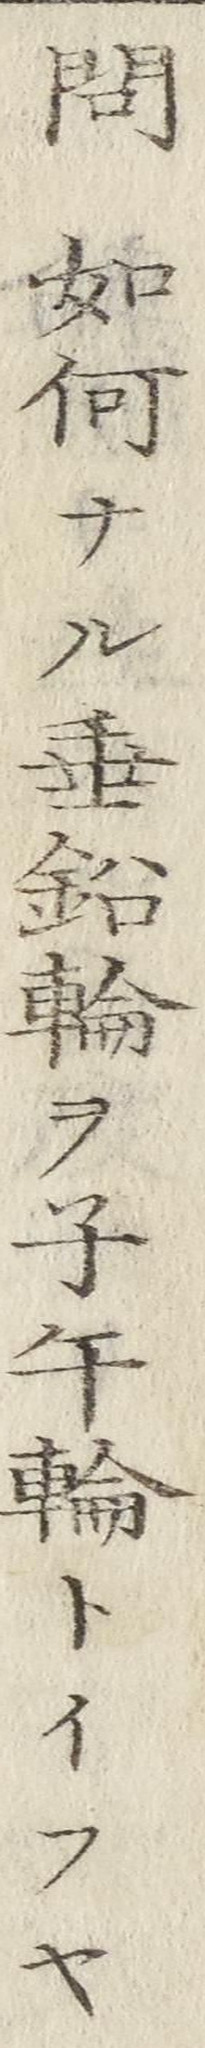問如何ナル垂鉛輪ヲ子午輪トイフヤ
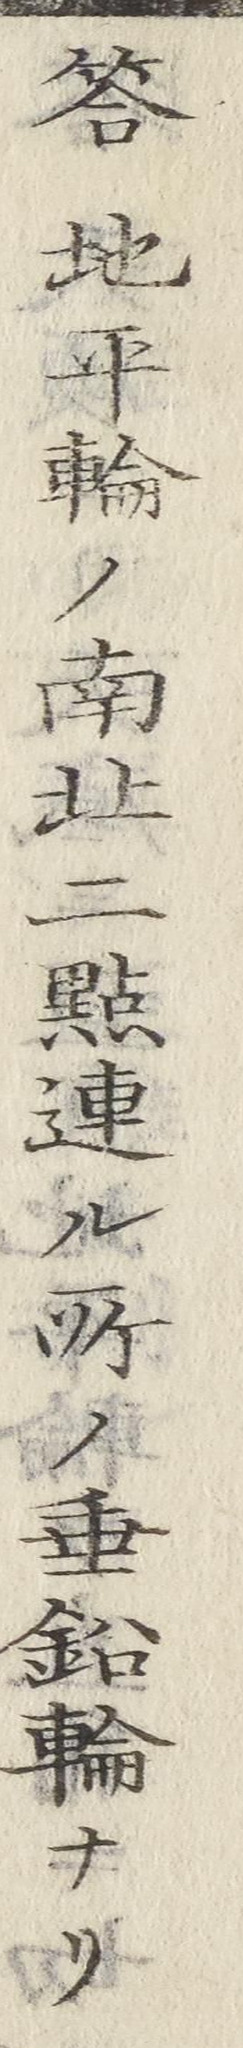答地平輪ノ南北ニ点蓮ル所ノ垂鉛輪ナリ
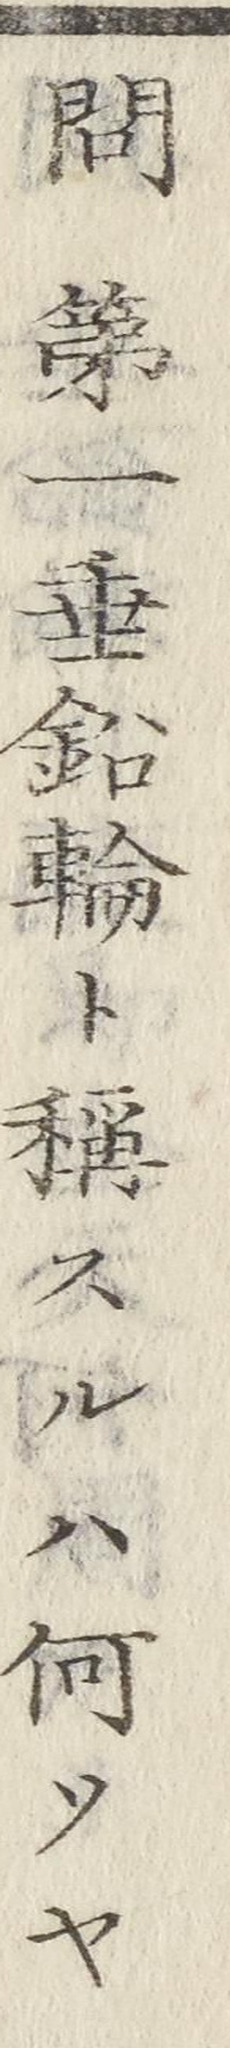問第一垂鉛輪ト称スルハ何ソヤ
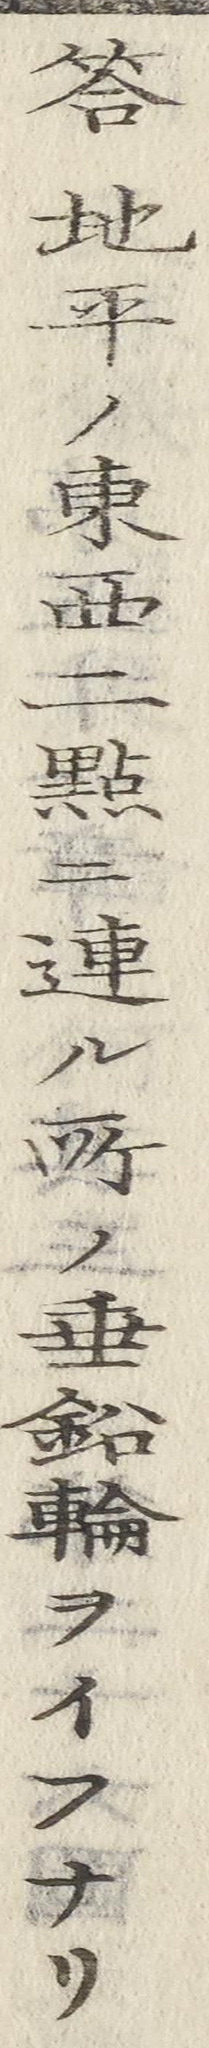答地平ノ東西ニ点ニ連ル所ノ垂鉛輪ヲイフナリ
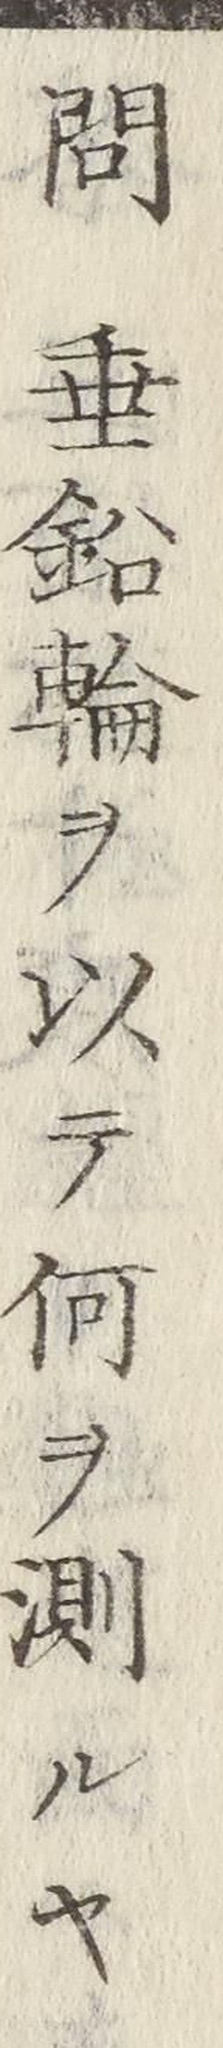問垂鉛輪ヲ以テ何ヲ測ルヤ
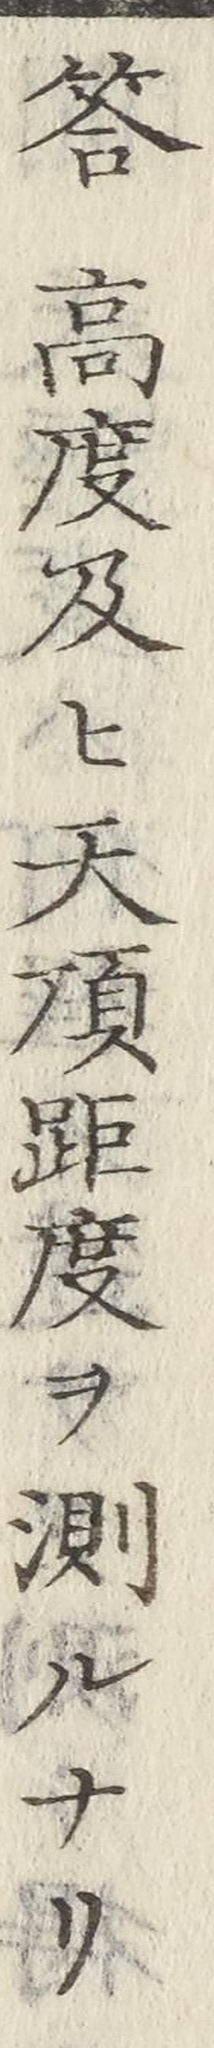答高度及ヒ天頂距度ヲ測ルナリ
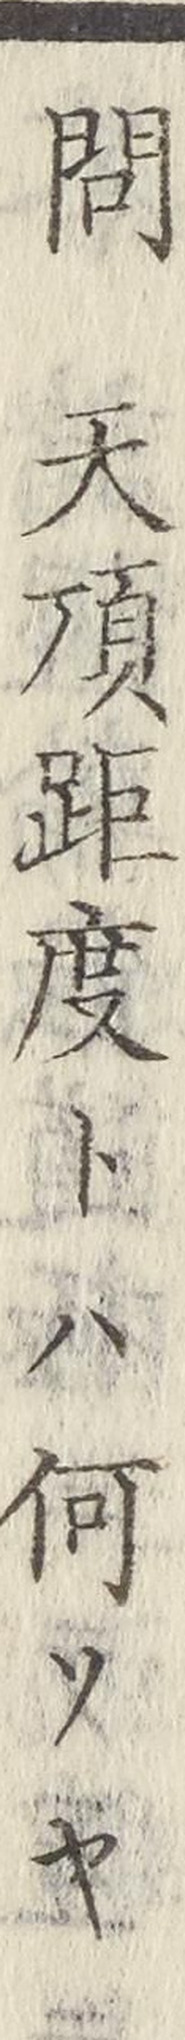問天頂距度トハ何ソヤ
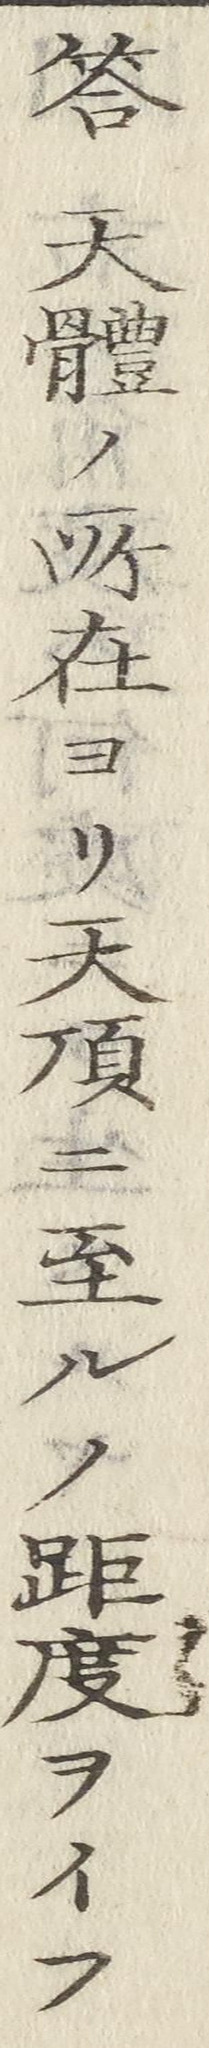答天体ノ所在ヨリ天頂ニ至ルノ距度ヲイフ
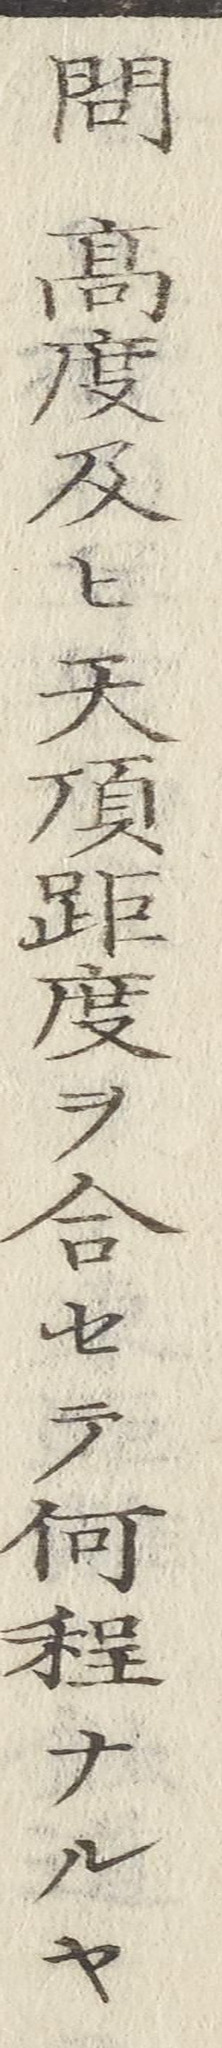問高度及ヒ天頂距度ヲ合セテ何程ナルヤ
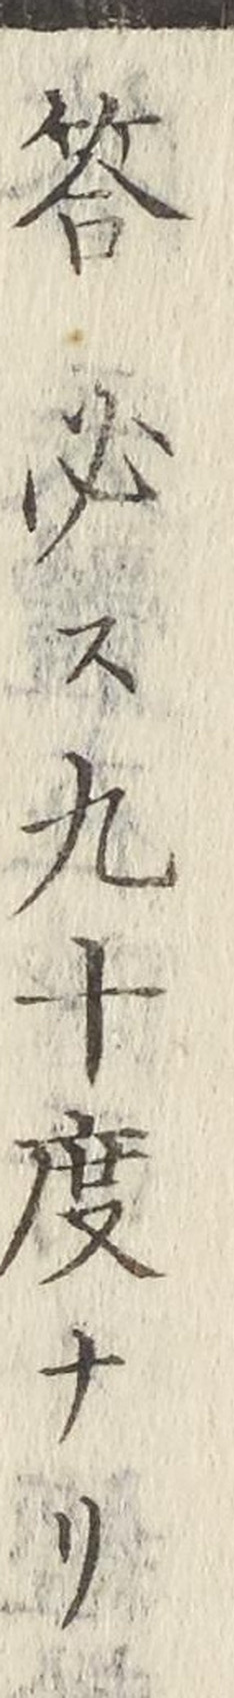答必ス九十度ナリ
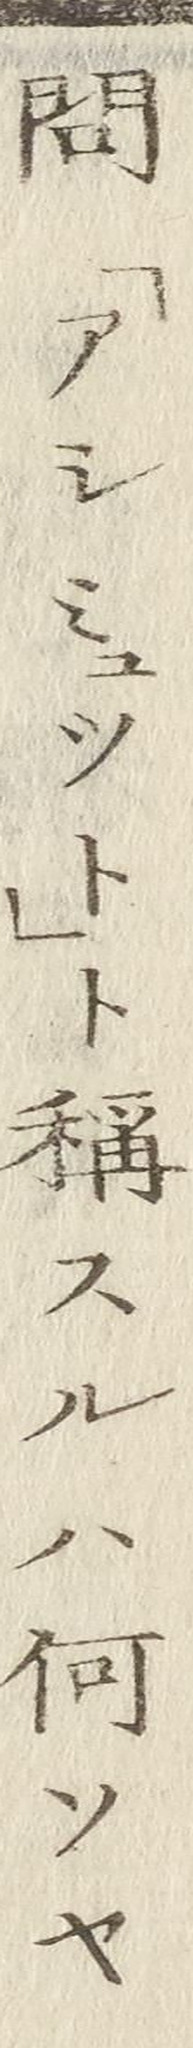問「アシミュツト」ト称スルハ何ソヤ
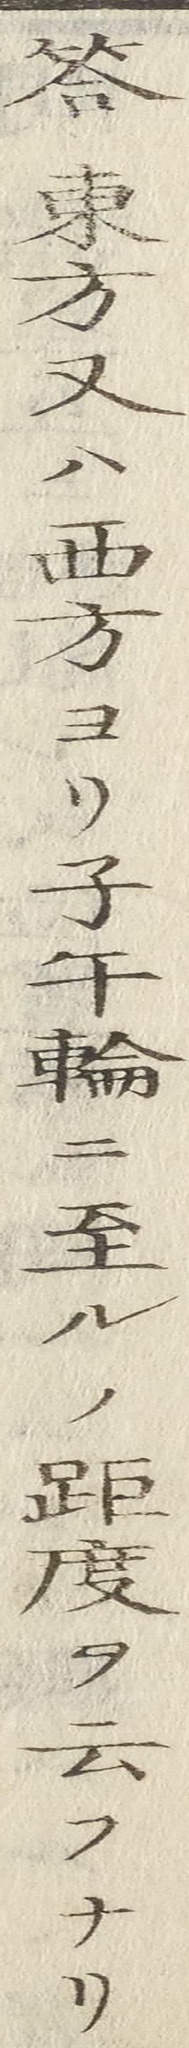答東方又ハ西方ヨリ子午輪ニ至ルノ距度ヲ云フナリ
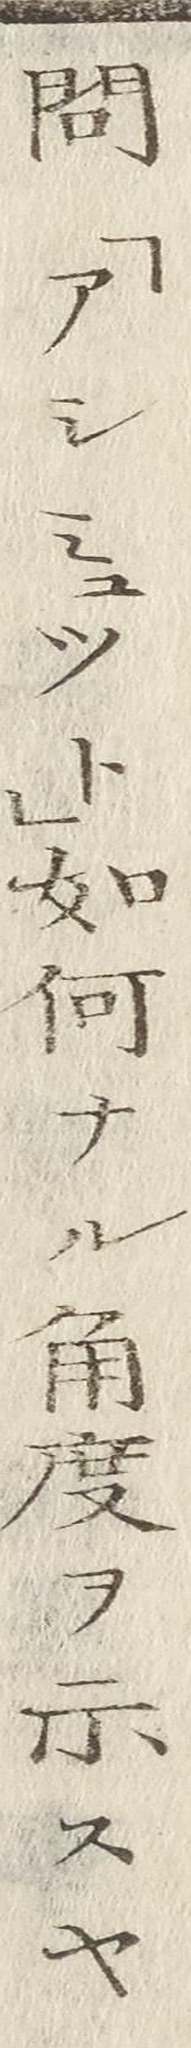問「アシミュツト」如何ナル角度ヲ示スヤ
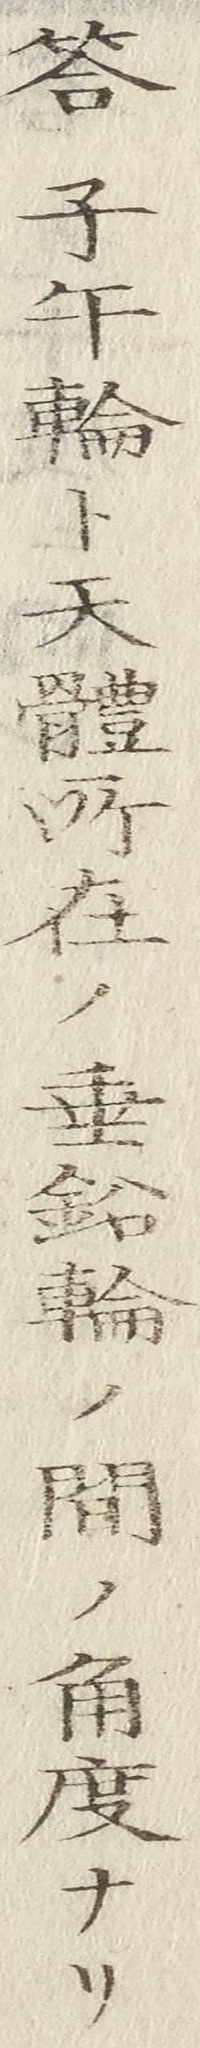答子午輪ト天体所在ノ垂鉛輪ノ間ノ角度ナリ
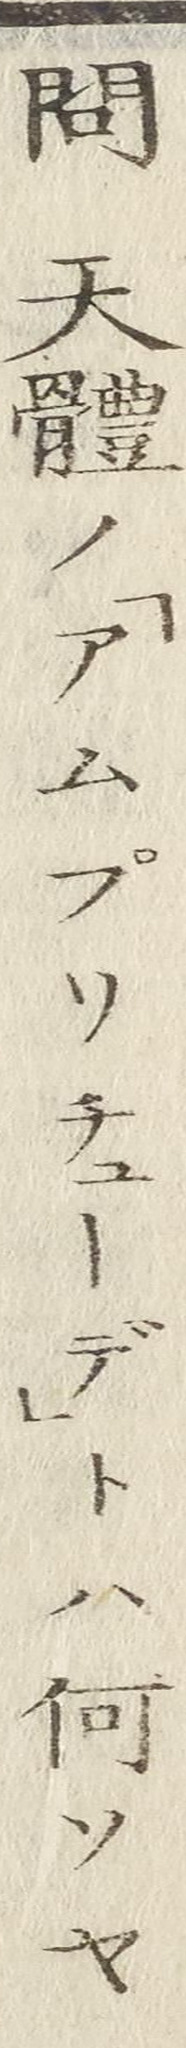問天体ノ「アムプリチューデ」トハ何ソヤ
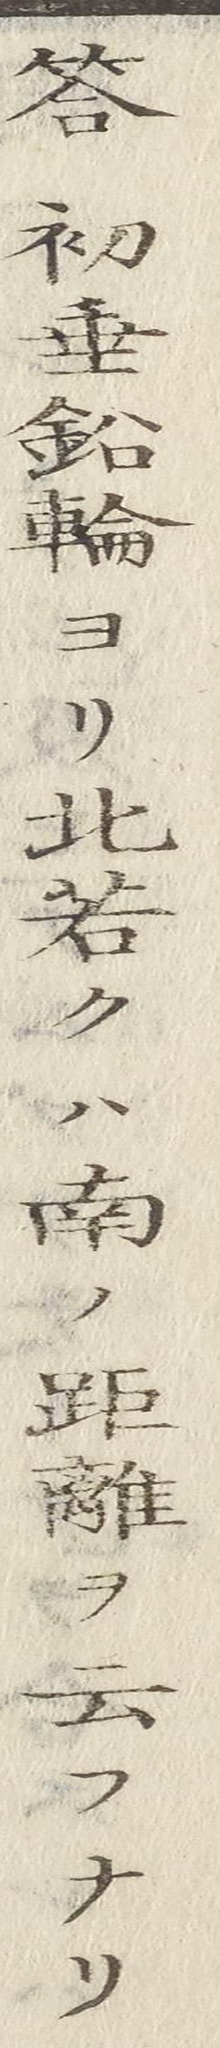答初垂鉛輪ヨリ北若クハ南ノ距離ヲ云フナリ
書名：星学圖説　下
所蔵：東京大学地震研究所図書室 Earthquake Research Institute Library, The University of Tokyo, JAPAN
